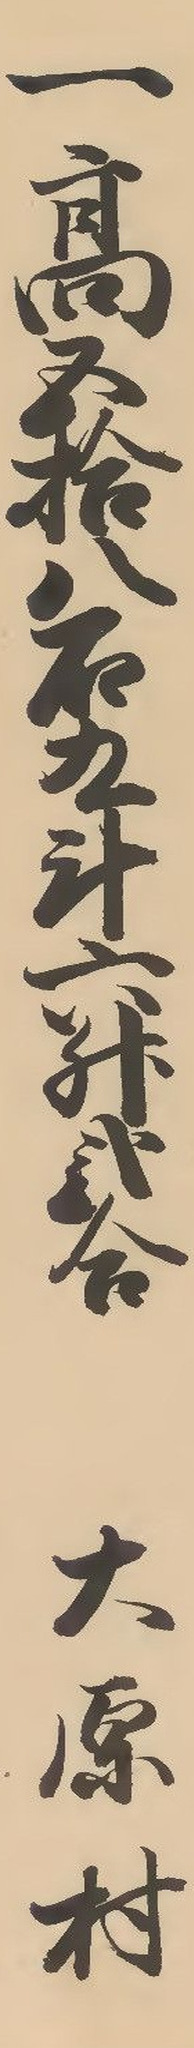一高五拾八石九斗六升弐合大原村

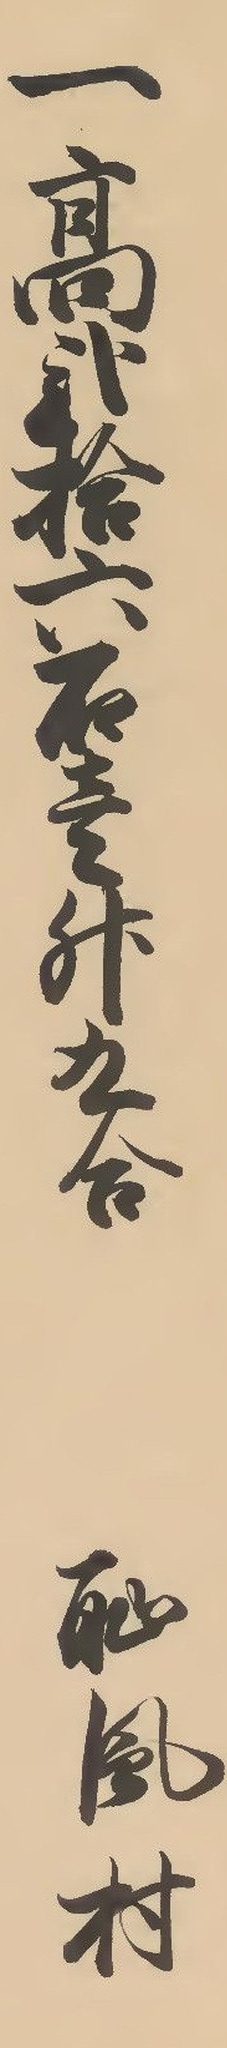一高弐拾六石壱升九合耻風村
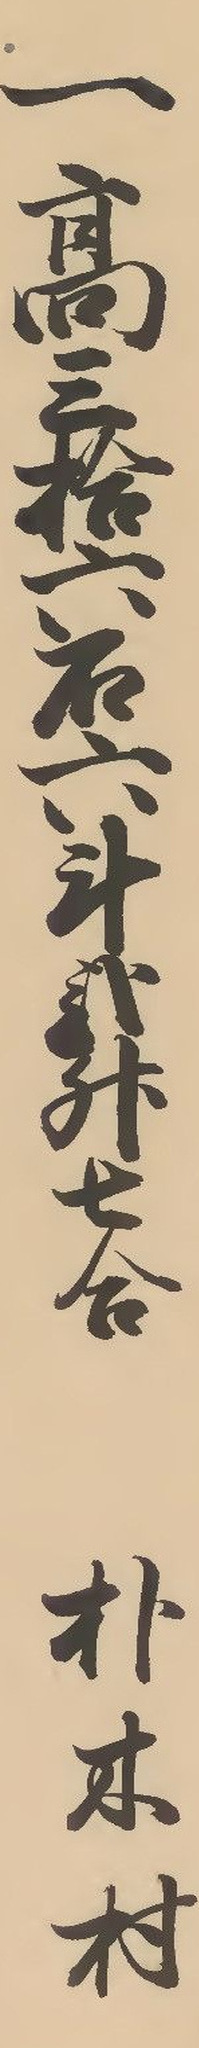一高三拾六石六斗弐升七合朴木村
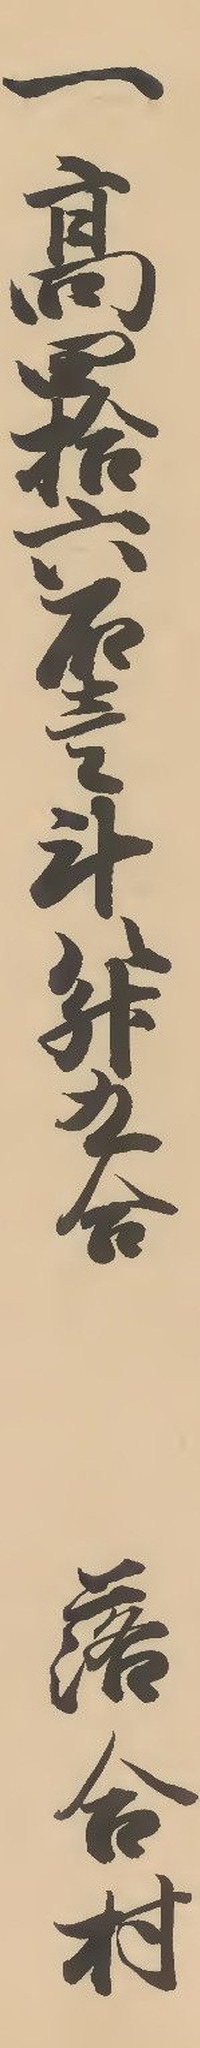一高四拾六石壱斗八升九合落合村
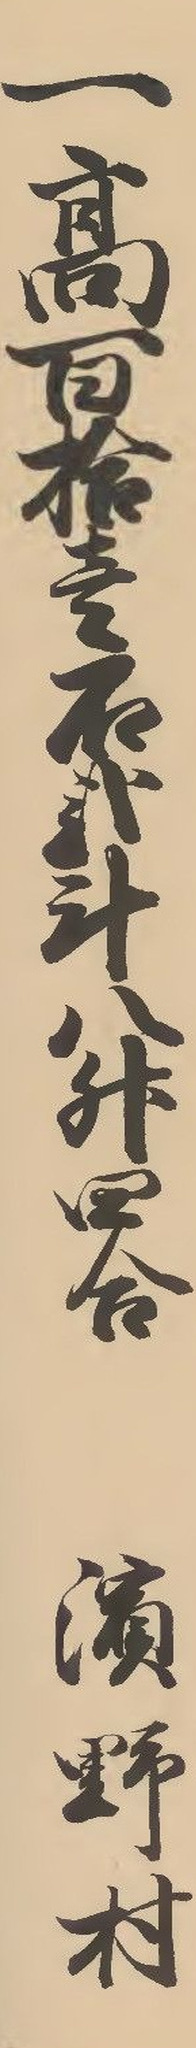一高百拾壱石弐斗八升四合浜野村
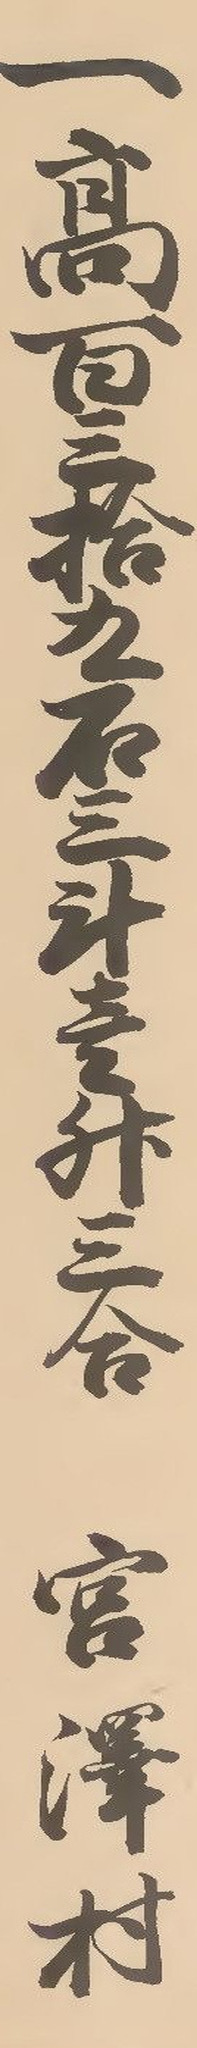一高百三拾九石三斗壱升三合宮沢村
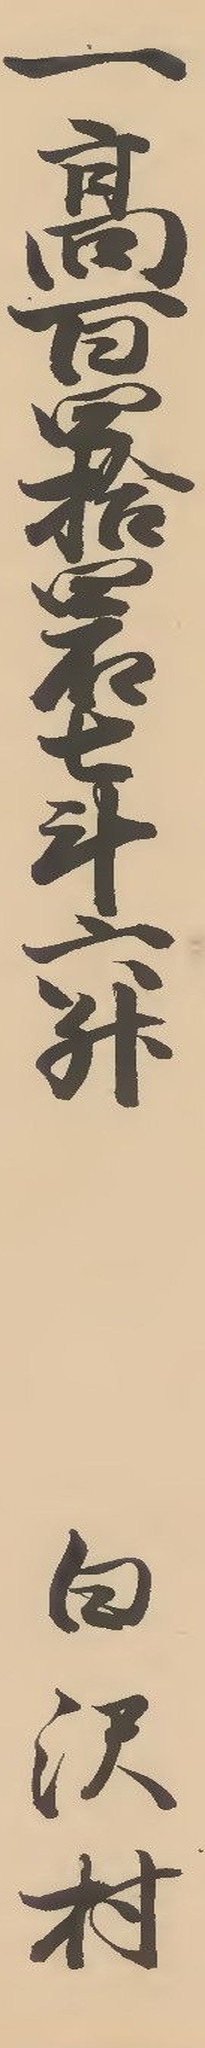一高百四拾四石七斗六升白沢村
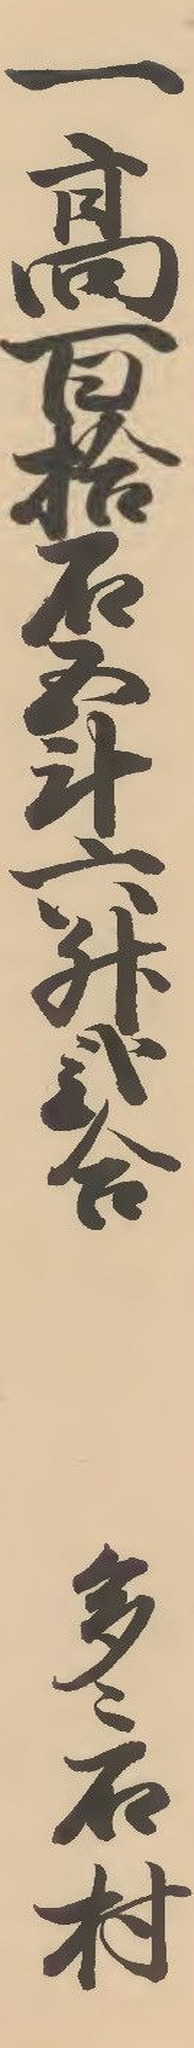一高百拾石五斗六升弐合多々石村
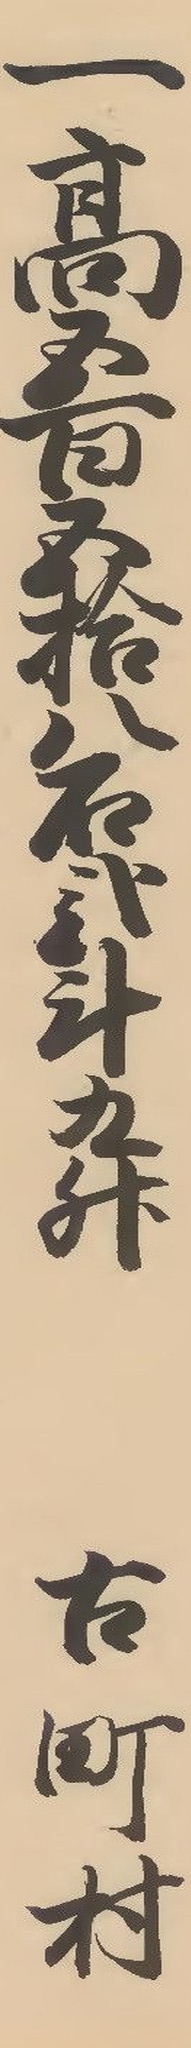一高五百五拾八石弐斗九升古町村

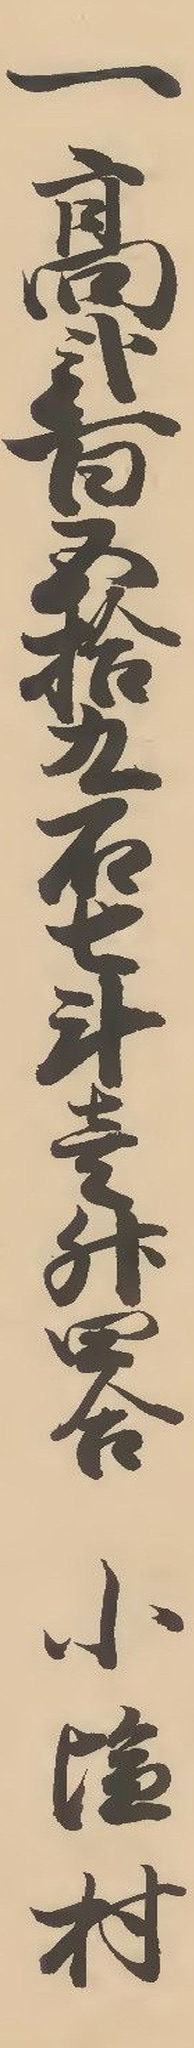一高弐百五拾九石七斗壱升四合小塩村
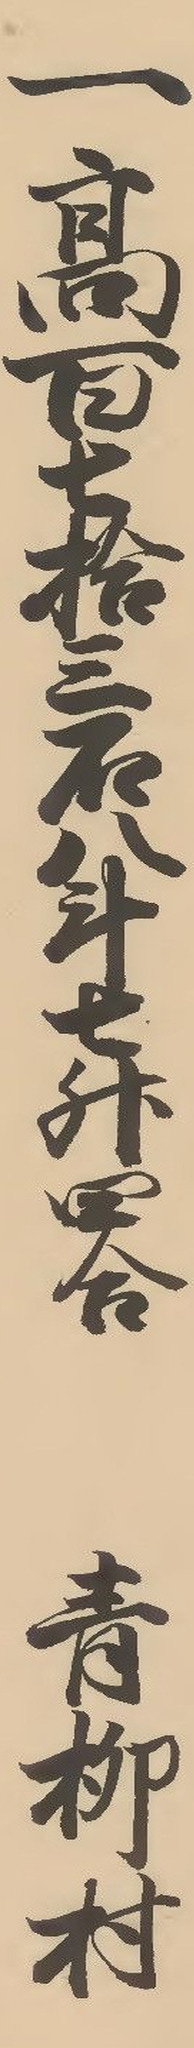一高百七拾三石八斗七升四合青柳村
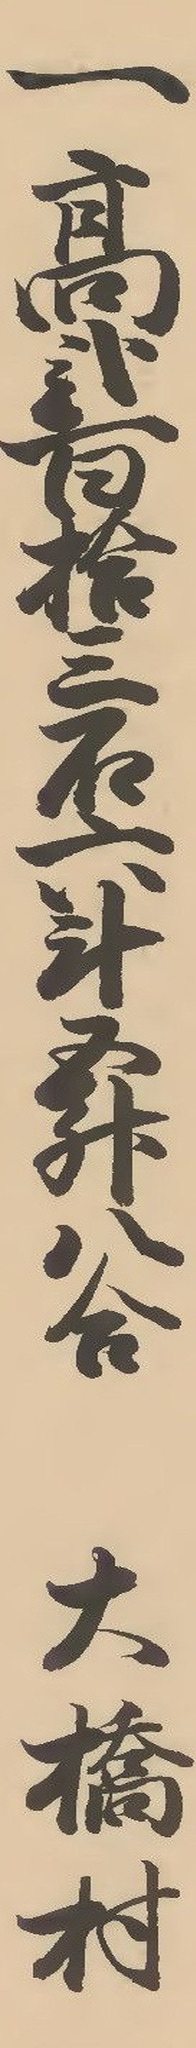一高弐百拾三石六斗五升八合大橋村
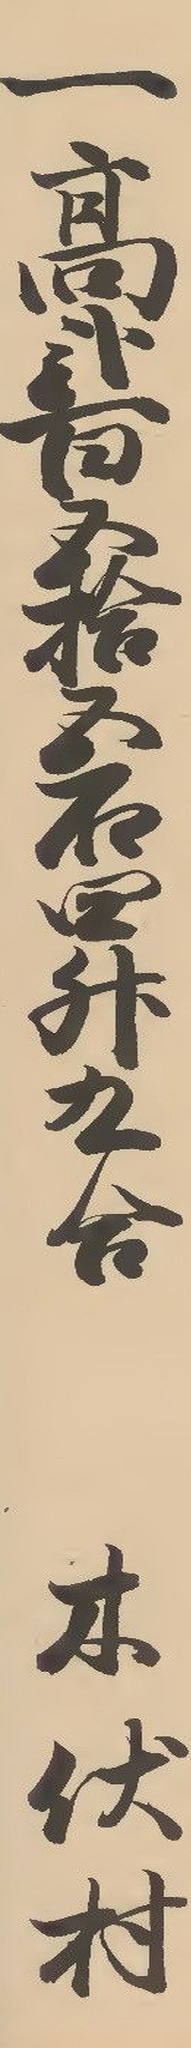一高弐百五拾五石四升九合木伏村
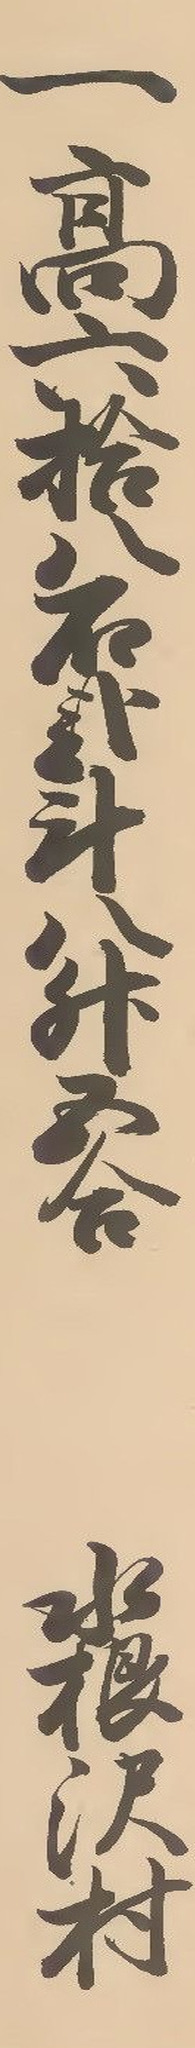一高六拾八石弐斗八升五合水根沢村
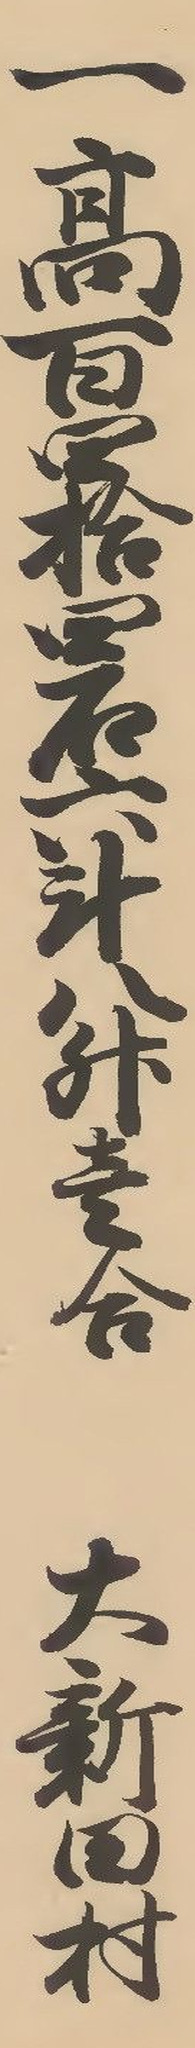一高百四拾四石六斗八升壱合大新田村
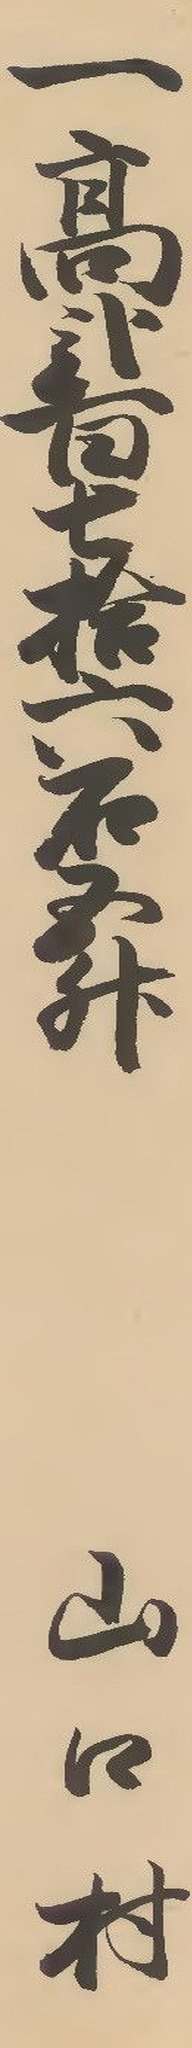一高弐百七拾六石五升山口村
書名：陸奥国郷帳　１
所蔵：国立公文書館 National Archives of Japan
